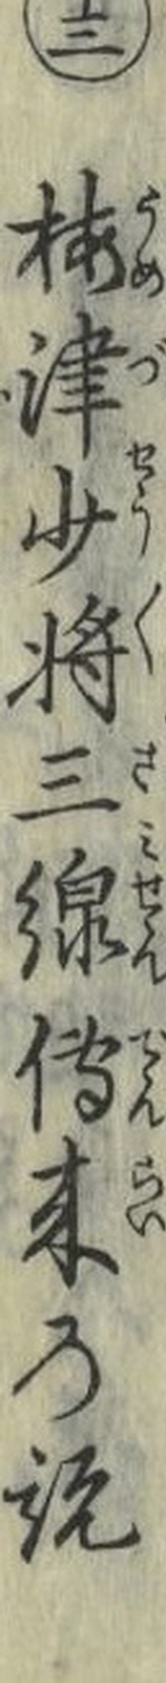十三梅津少将三線傳来の説
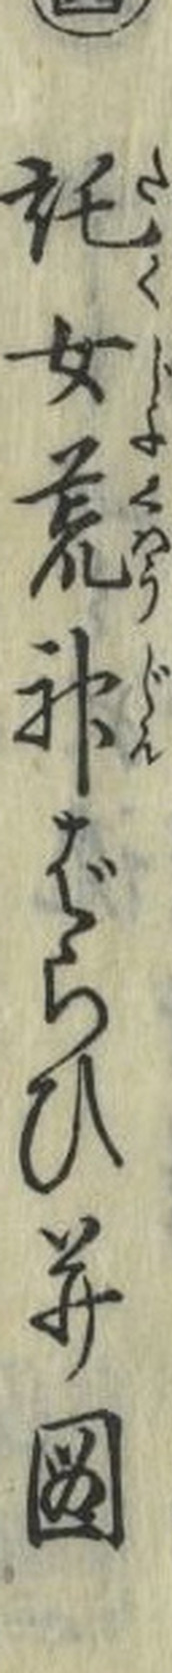十四託女荒神ばらひ并図
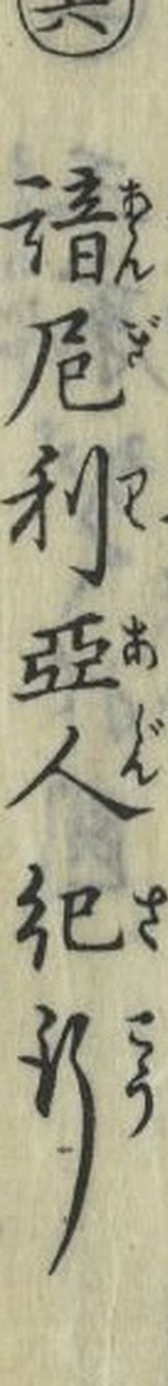十六諳厄利亞人紀行
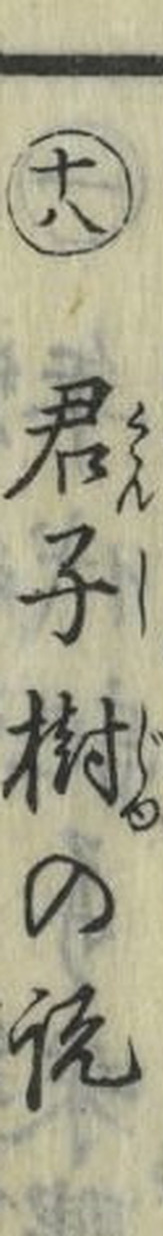十八君子樹の説
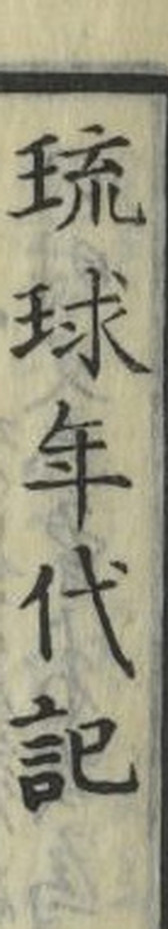琉球年代記
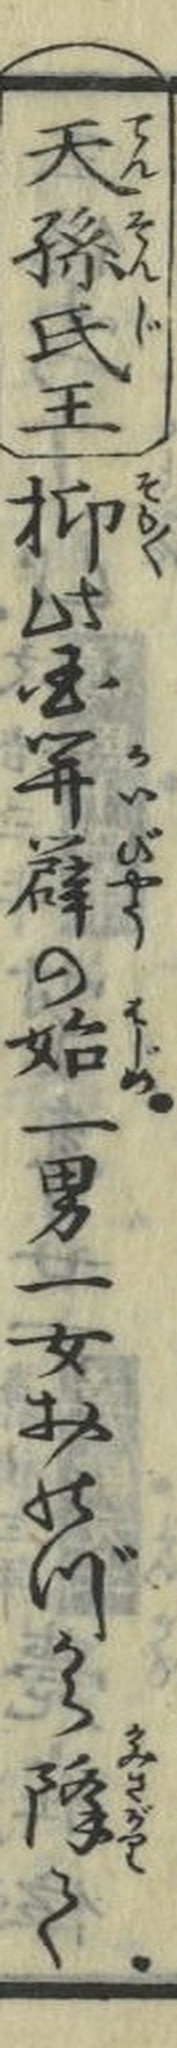(天孫氏王)抑此国開闢の始・一男一女おのづから降て・
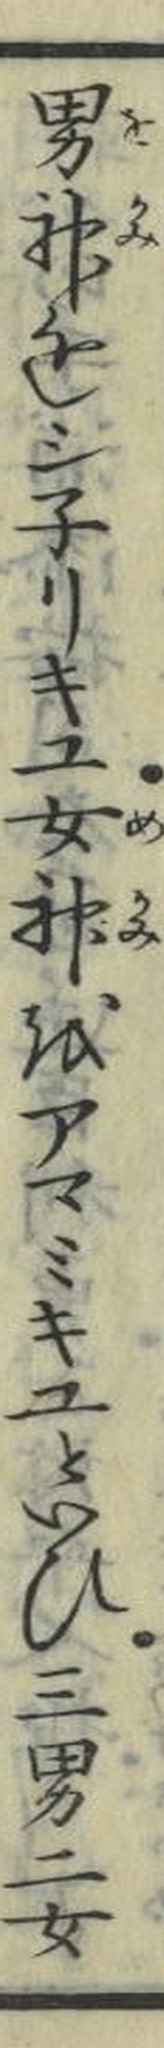男神をシネリキユ・女神をアマミキユといひ・三男二女
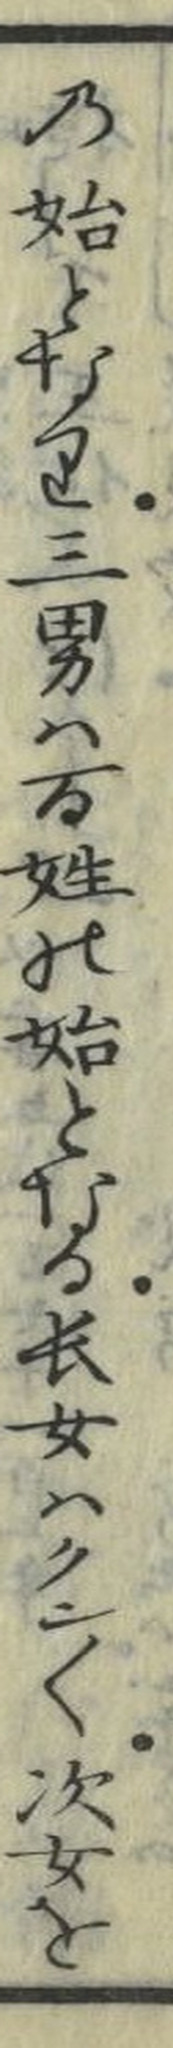の始となり・三男は百姓の始となる・長女はクン〳〵・次女を
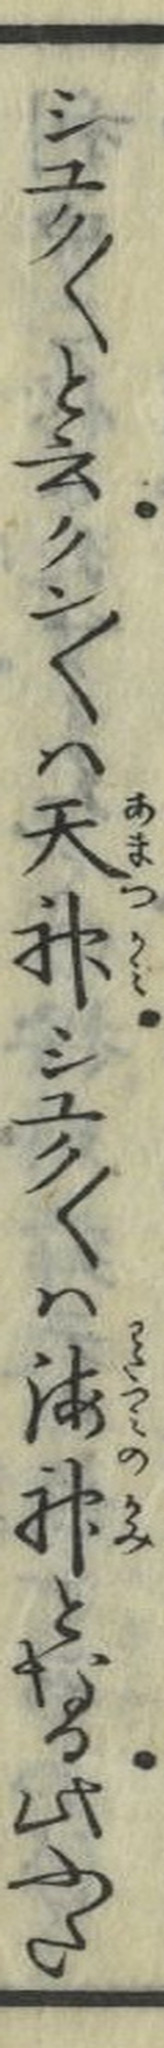シユク〳〵と云・クン〳〵は天神・シユク〳〵は海神となる・此ふた
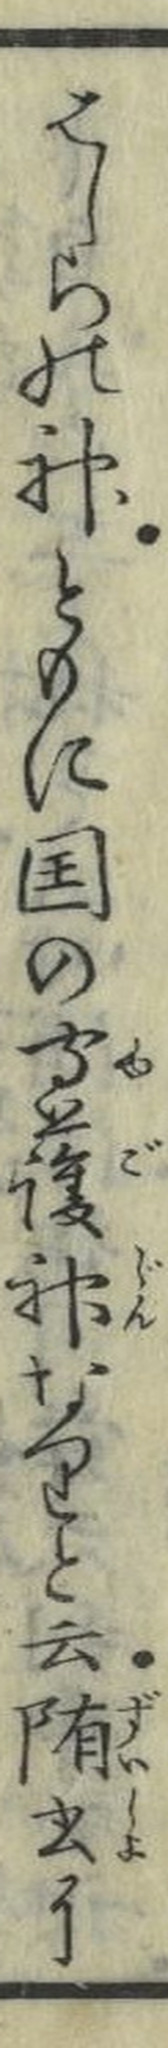はしらの神・ともに国の守護神なりと云・陏書に
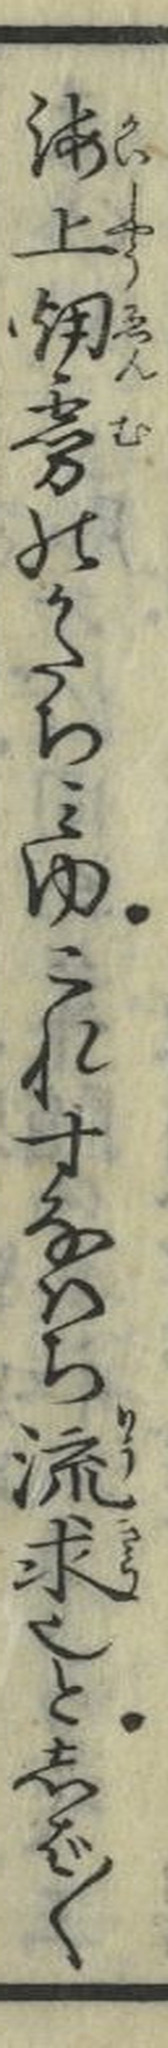海上烟霧のかたちみゆ・これすなはち流求也と・しば〳〵

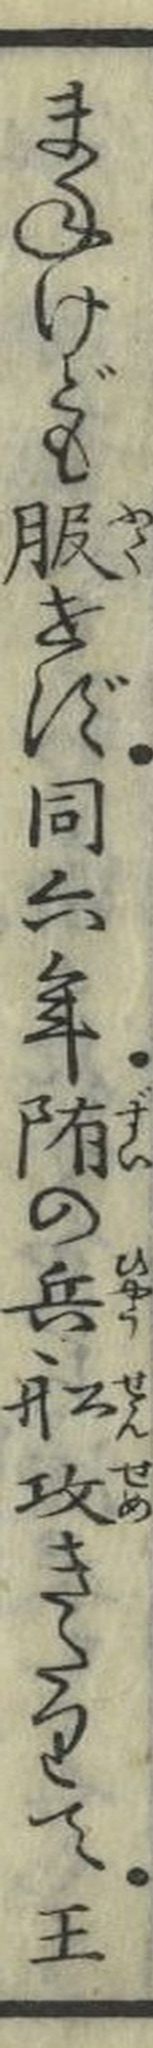まねけども服せず・同六年・陏の兵船攻きたりて・王
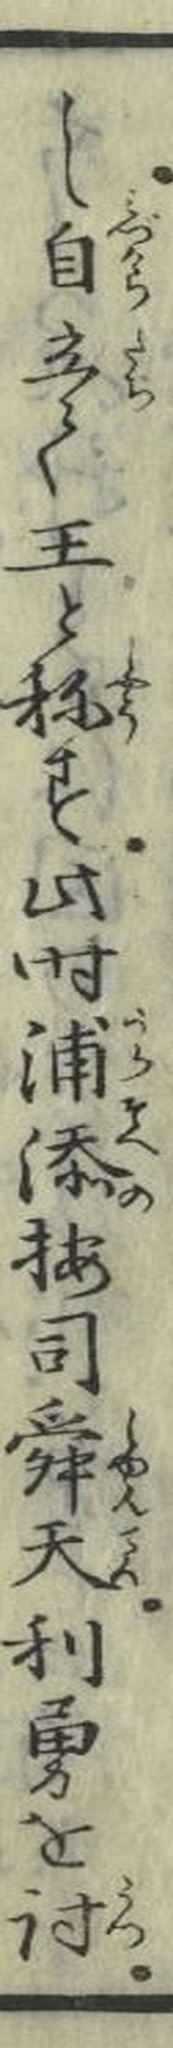し・自立て王と称す・此時浦添按司舜天・利勇を討・
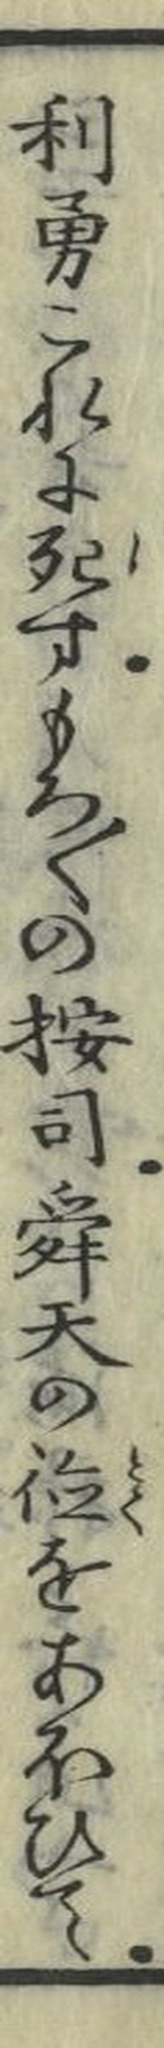利勇これに死す・もろ〳〵の按司・舜天の德をあほひて・
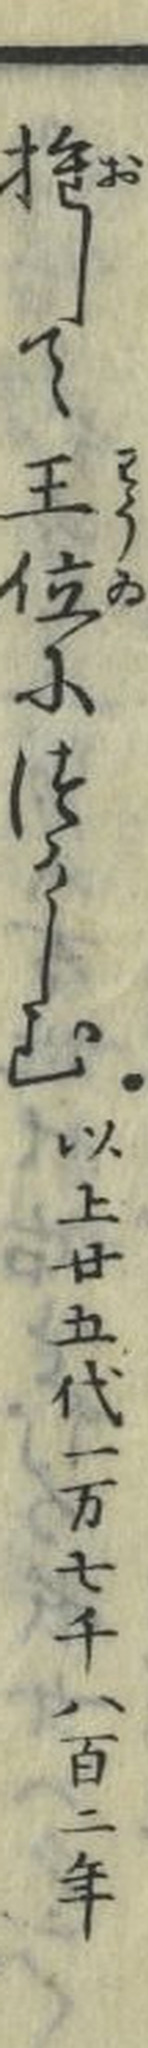推して王位につかしむ・以上廿五代一万七千八百二年
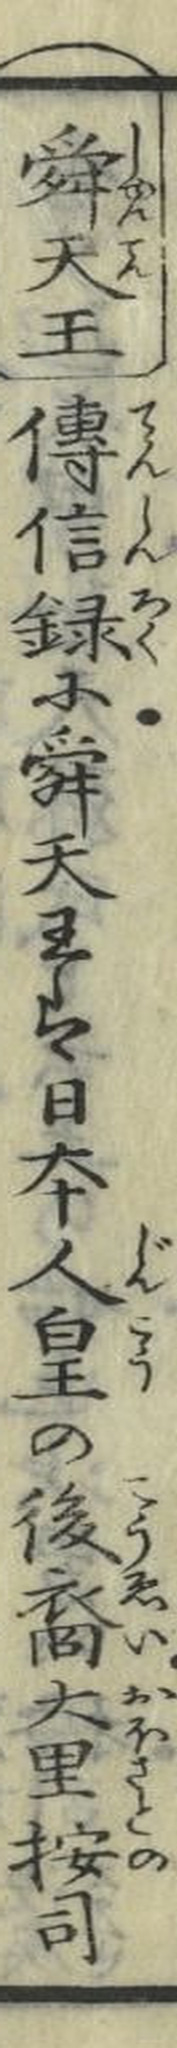(舜天王)傳信録に・舜天王は日本人皇の後裔・大里按司
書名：琉球秊代記 附雑話 全
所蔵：University of the Ryukyus Library
